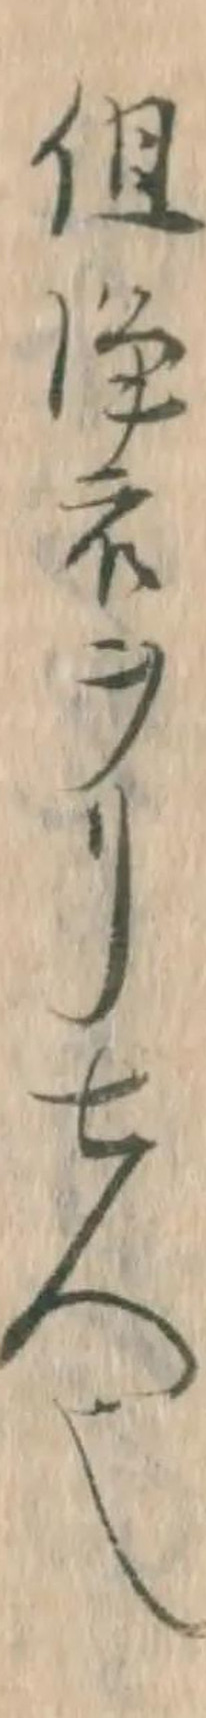但浄衣ヲリ七人也
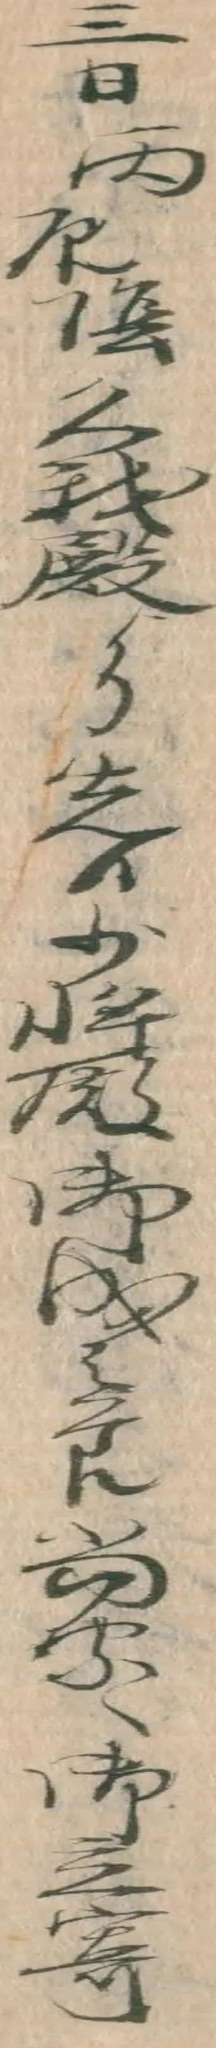三日丙辰陰久我殿より先御少将殿御成之節當家へ御立寄
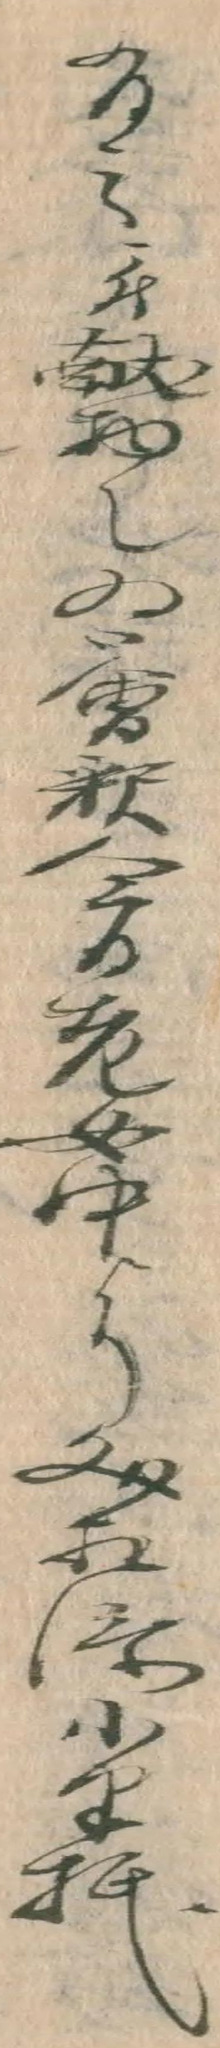有之ニ付献物之為御會釈今日老女中より処相添小半紙
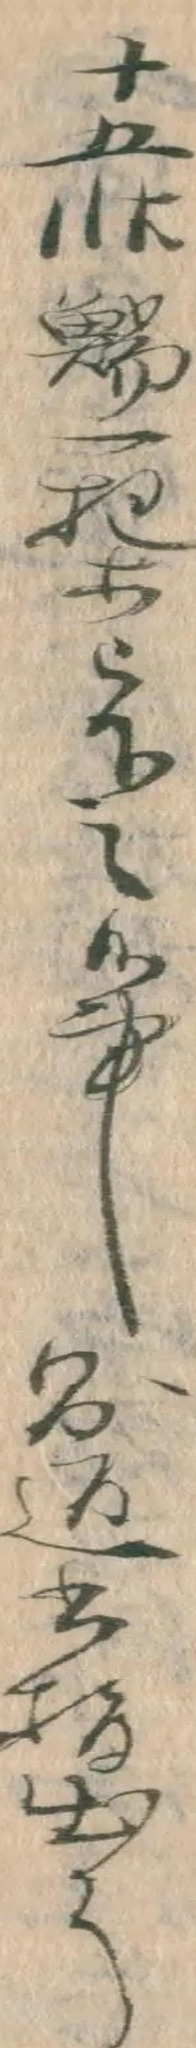十五帖鯣一把等被下之候事則返書指出了
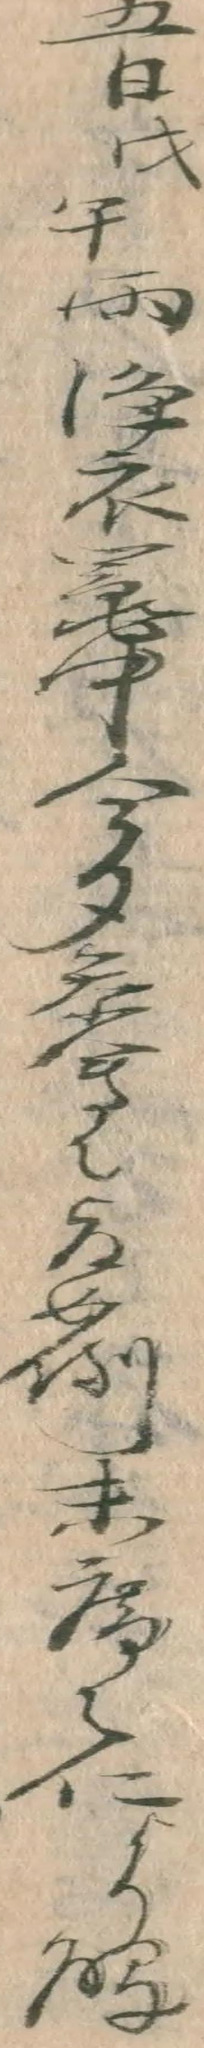五日戊午雨浄衣鬮中今夕参會之旨如例未席之仁より触
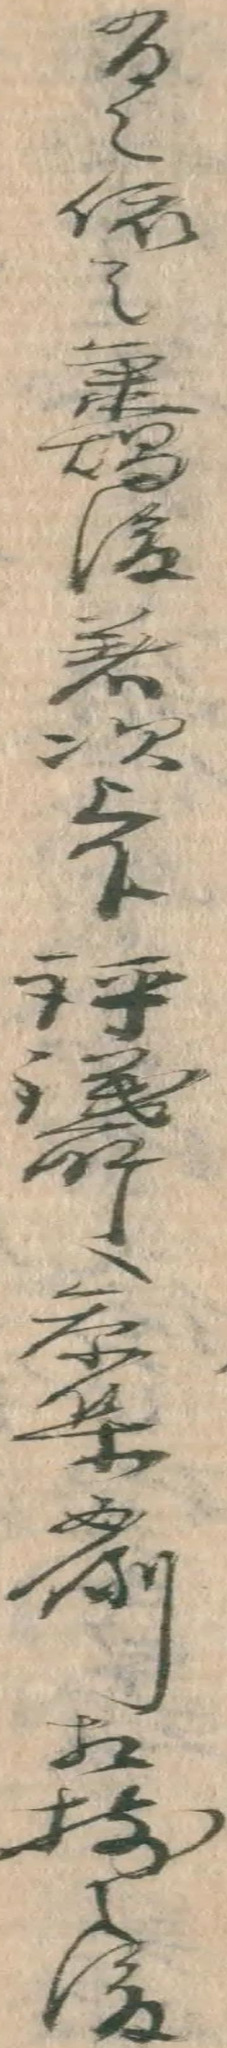有之依之秉燭後着次上下評議所へ参集如例相揃之後
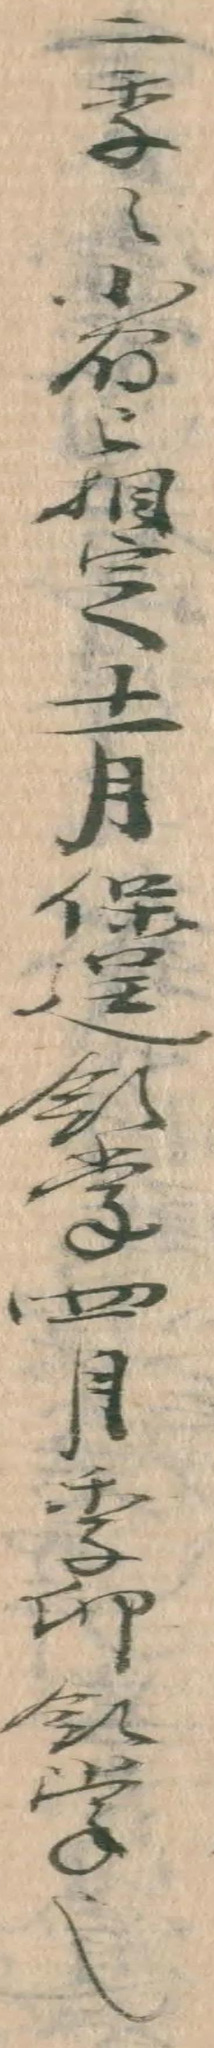二季之小有被相定十一月保逞領掌四月季卯領掌也
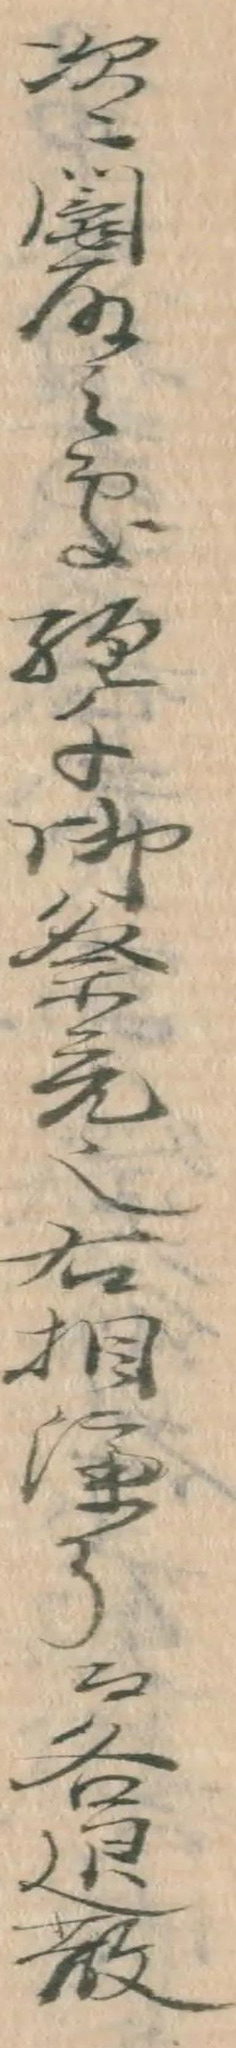次ニ鬮取之處軽千御祭充也右相済了而各退散
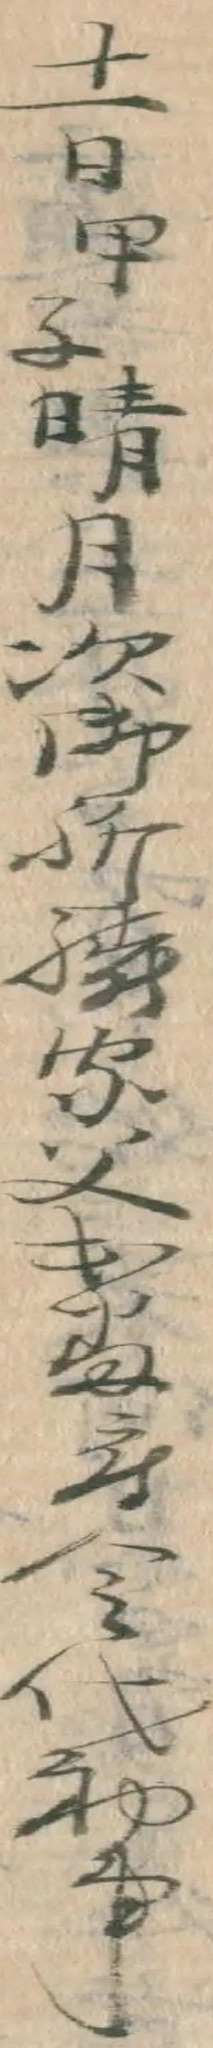十一日甲子晴月次御祈祷家父義番ニ付令代勤事
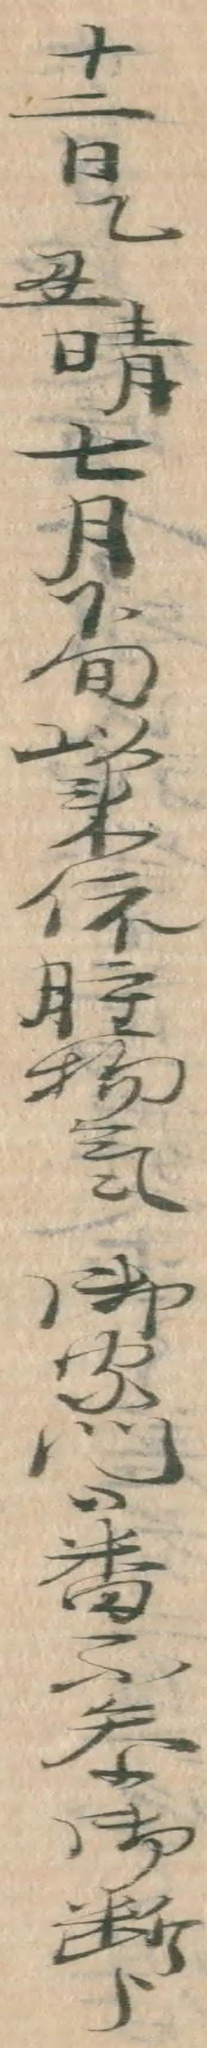十二日乙丑晴七月下旬以来依腫物気御家門御番不参御断申
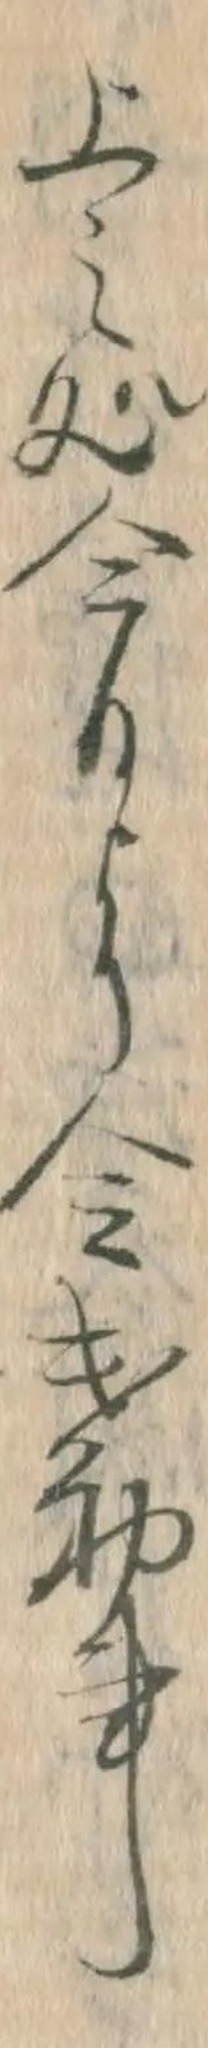上之処今日より令出勤事
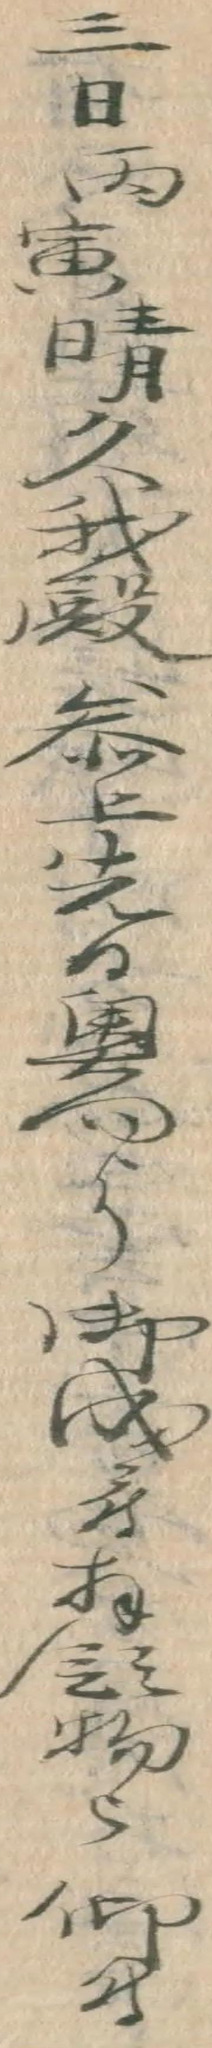十三日丙寅晴久我殿へ参上先日奥向より御成に付拝領物被仰付
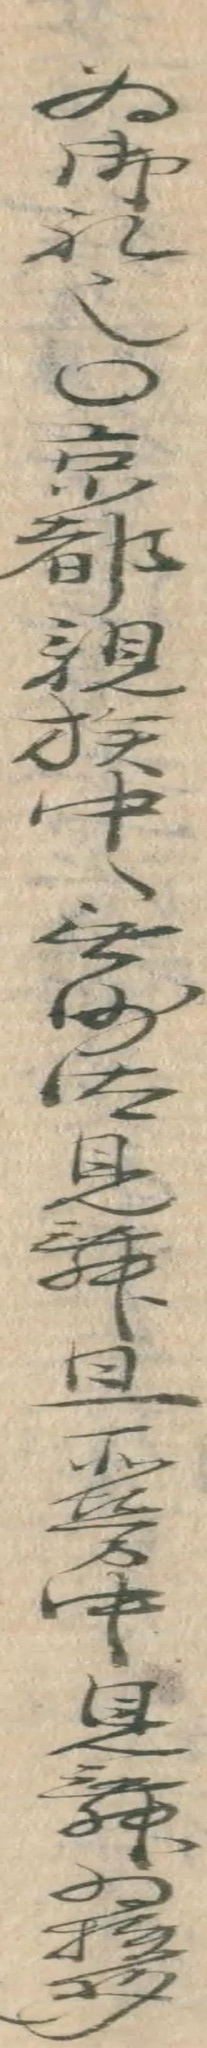為御礼也○京都親族中へ無沙汰見舞且所労中見舞為挨拶
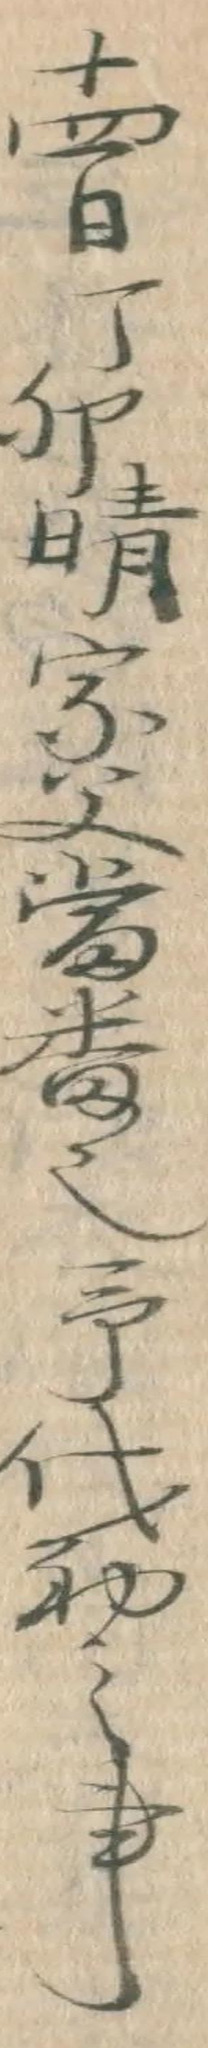十四日丁卯晴家父當番也予代勤之事
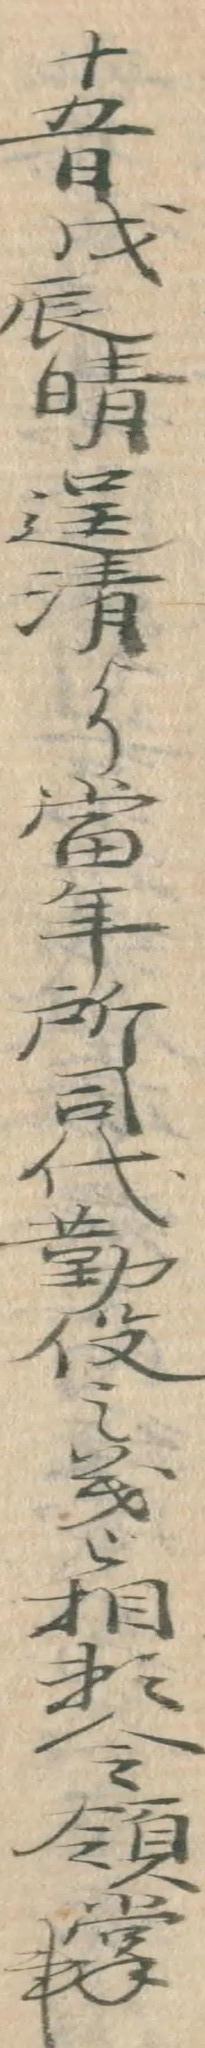十五日戊辰晴逞清より當年所司代勤役之義被相頼令領掌事
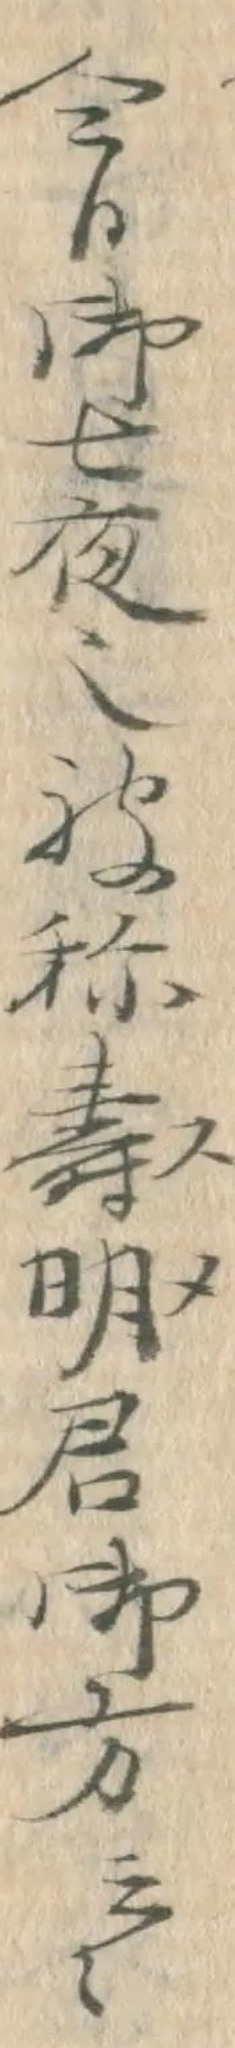今日御七夜也被称寿明君御方云々
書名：賀茂社記録. 第65冊
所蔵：国立国会図書館 National Diet Library, JAPAN
